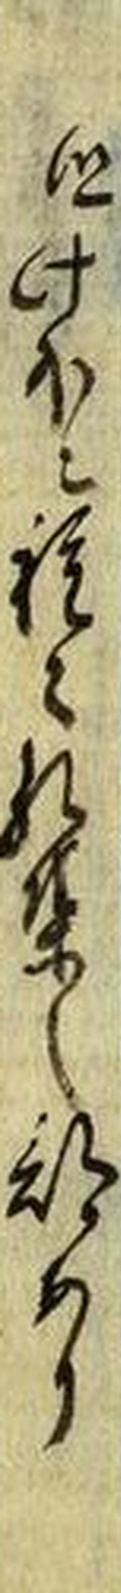但此外に種々類集之部あり
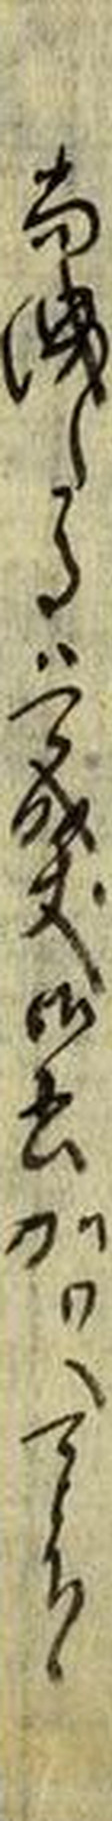尚洩たるは可成丈御書加わへ可被下候
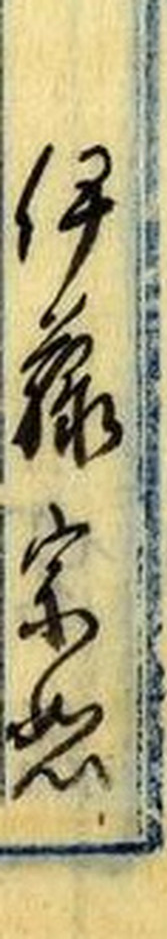伊藤宗恕
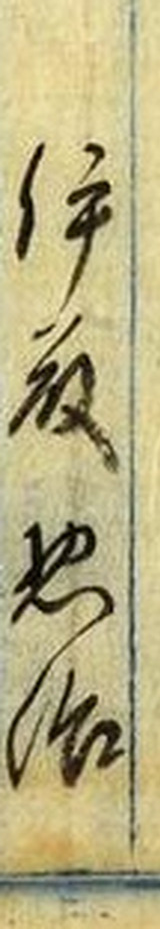伊藤惣治
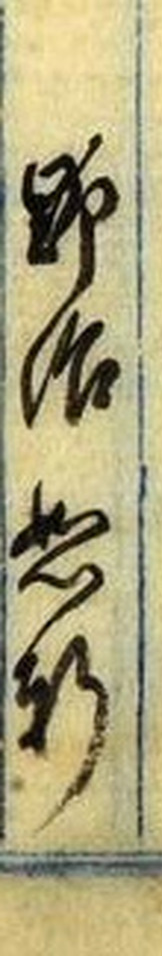野治恕軒

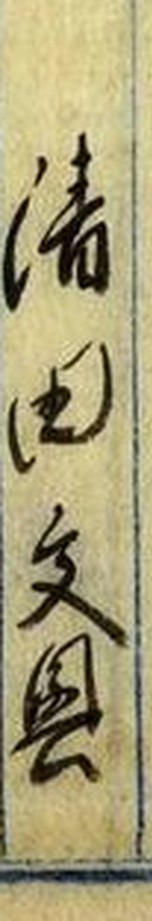清田文奥
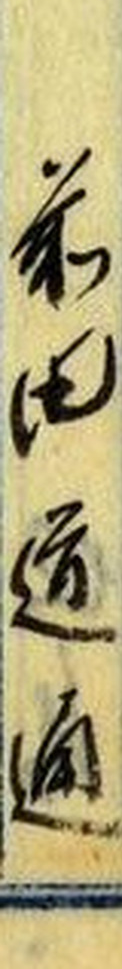前田道通
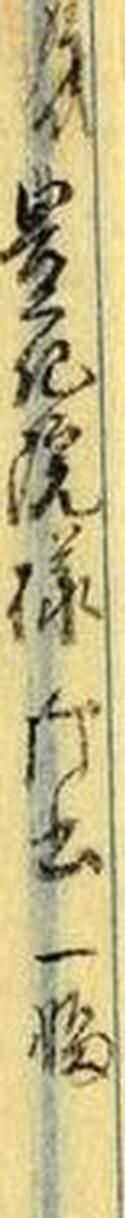豊記院様御書一幅
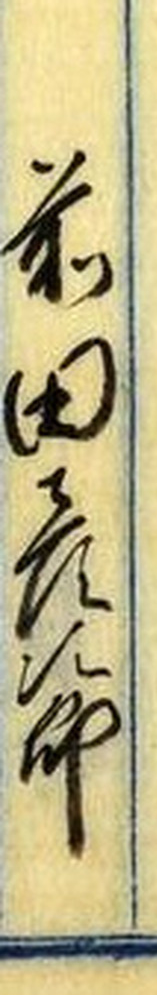前田彦次郎
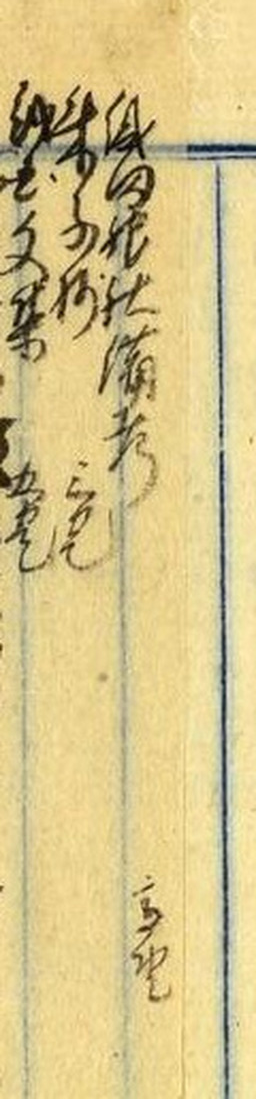織田神社備考高野
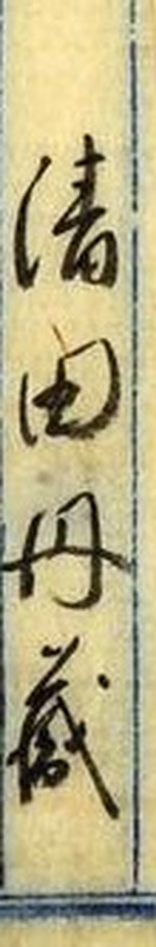清田丹蔵

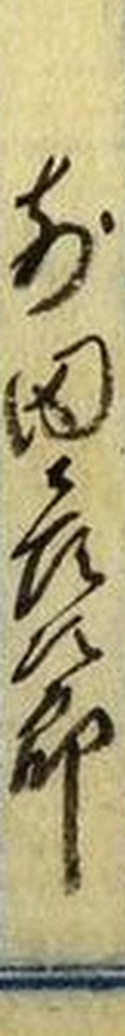前田彦次郎
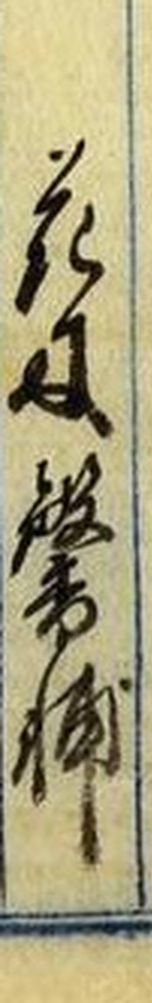花木馨輔
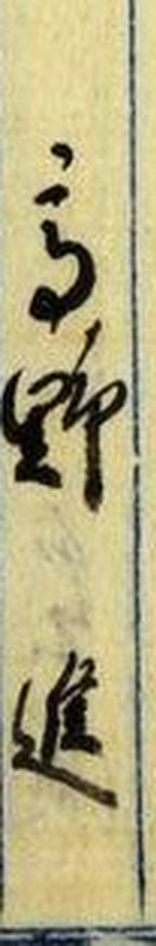高野進
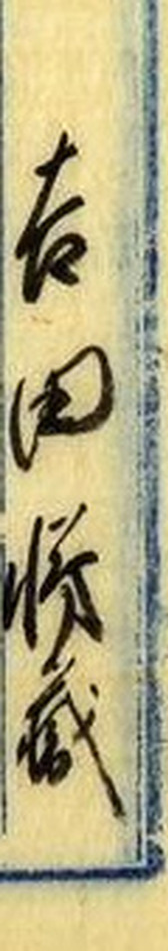吉田悌蔵
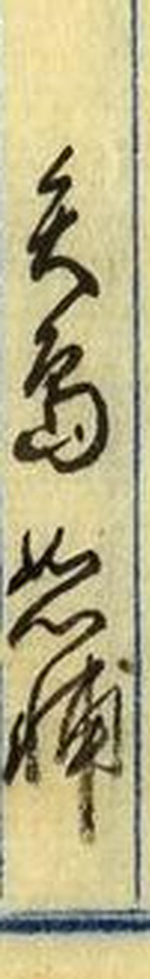矢島恕輔
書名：温古集 四巻
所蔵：福井県文書館 Fukui Prefectural Archives
